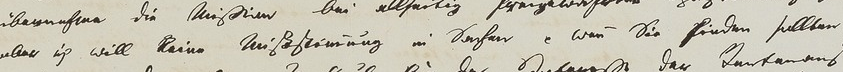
aber ich will keine Mißstimmung in Sachen & wenn Sie finden sollten,
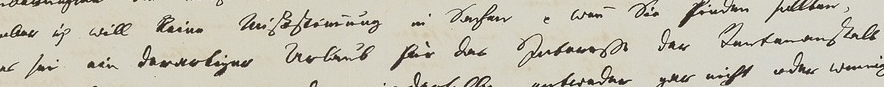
es sei ein derartiger Urlaub für das Interesse der Rentenanstalt
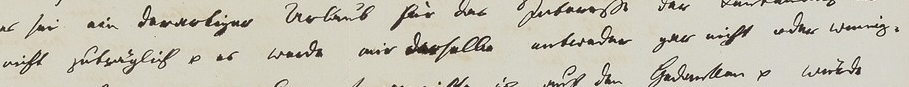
nicht zuträglich & es werde mir derselbe entweder gar nicht oder wenig-
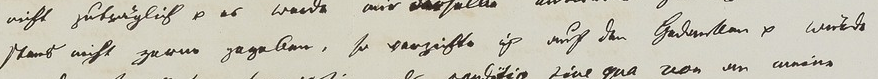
stens nicht gerne gegeben, so verzichte ich auf den Gedanken & werde
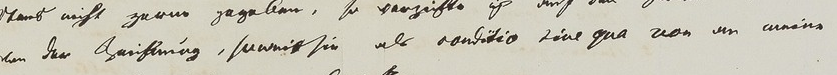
von der Zeichnung, soweit sie als conditio sine qua non an meine
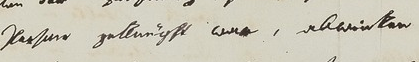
Person geknüpft war, abwinken.
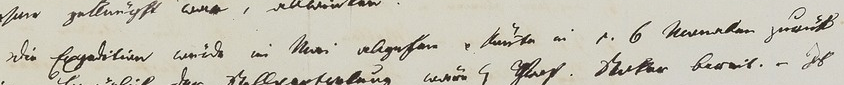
Die Expedition würde im Mai abgehen & könnte in c. 6 Monaten zurük
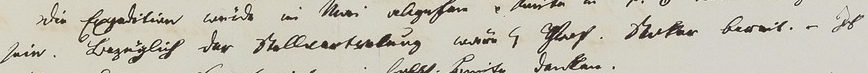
sein. Bezüglich der Stellvertretung wäre Herr Prof. Stokar bereit. – Ich
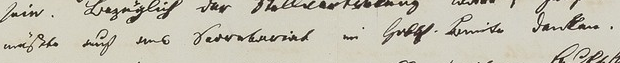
müßte auch ans Secretariat im Grdgs.Comite denken.
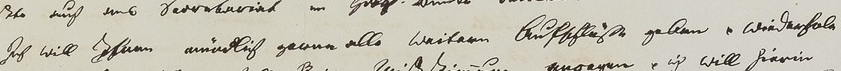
Ich will Ihnen mündlich gerne alle weitern Aufschlüsse geben & wiederhole
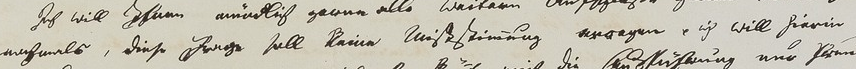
nochmals, diese Frage soll keine Mißstimmung erregen & ich will hierin
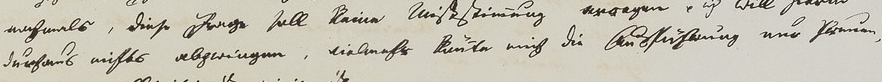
durchaus nichts abzwingen, vielmehr könnte mich die Ausführung nur freuen,
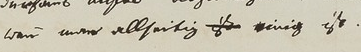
wenn man allseitig ist einig ist.
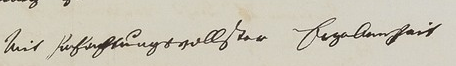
Mit hochachtungsvollster Ergebenheit
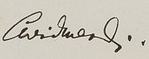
C Widmer di
